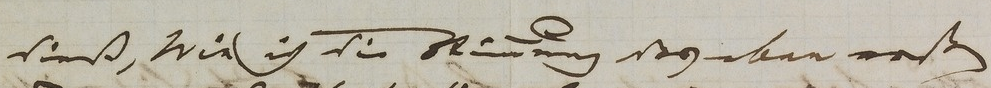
dieß, wie ich die Stimmung des eben erst
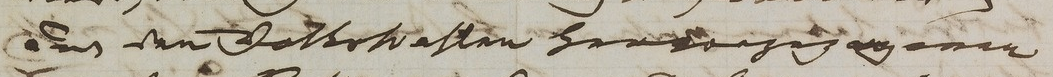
aus den Volkswahlen hervorgegangenen
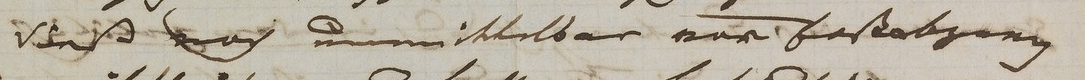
dieß noch unmittelbar vor Postabgang
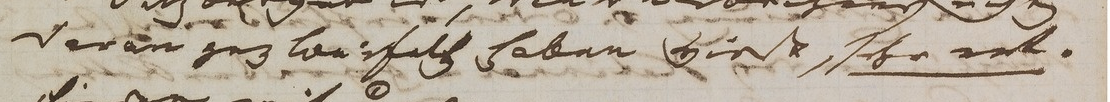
daran gezweifelt haben wirst, sehr ent-
